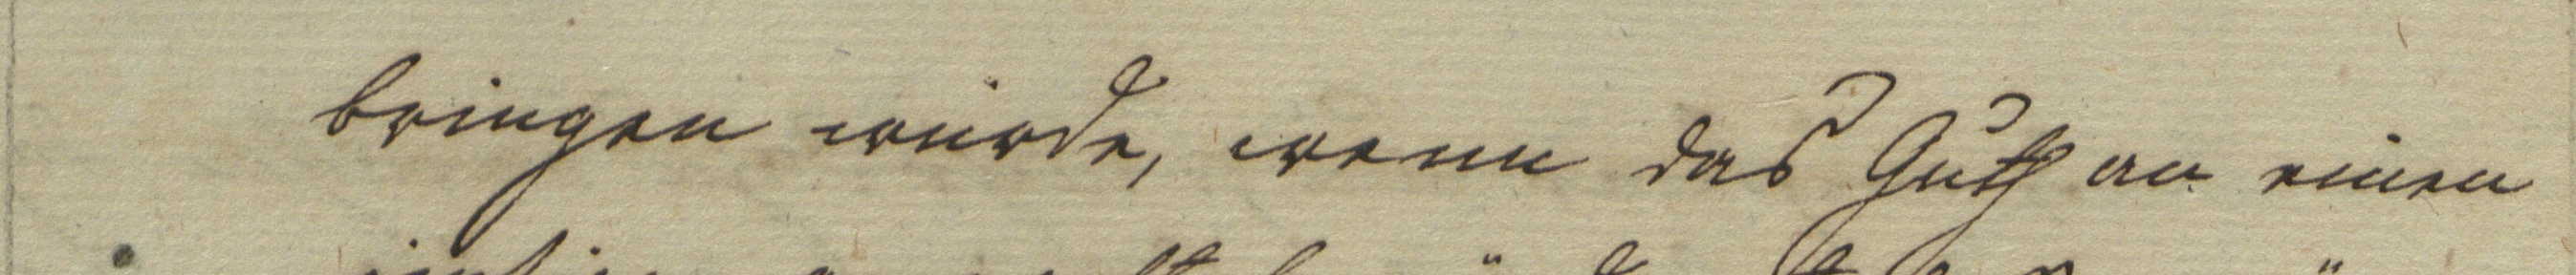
bringen würde, wenn das Guth an einen
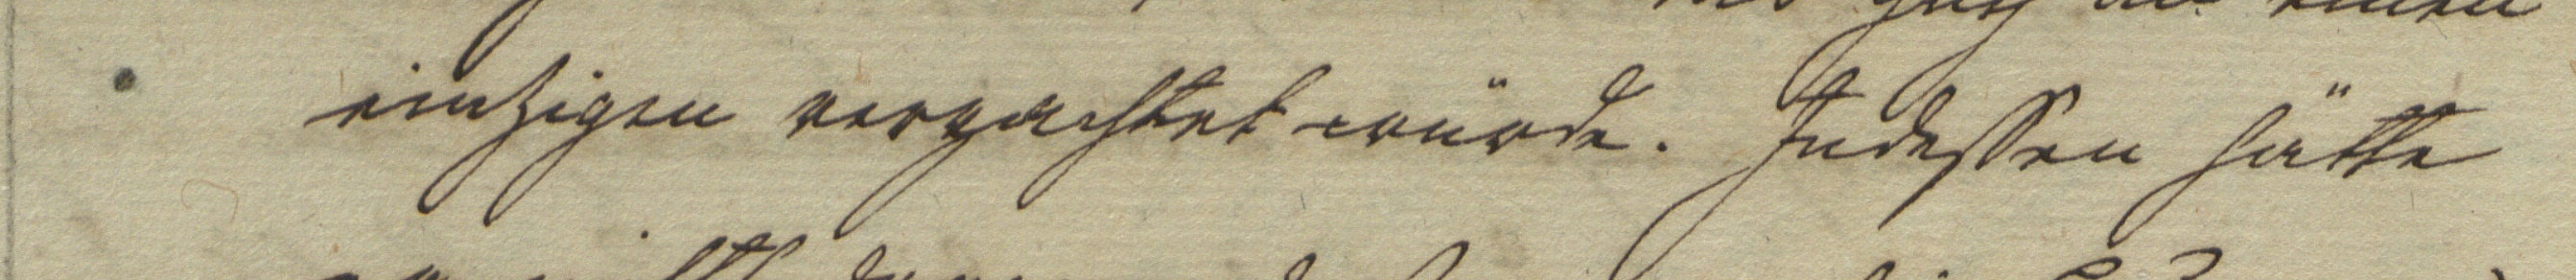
einzigen verpachtet würde. Indessen hätte
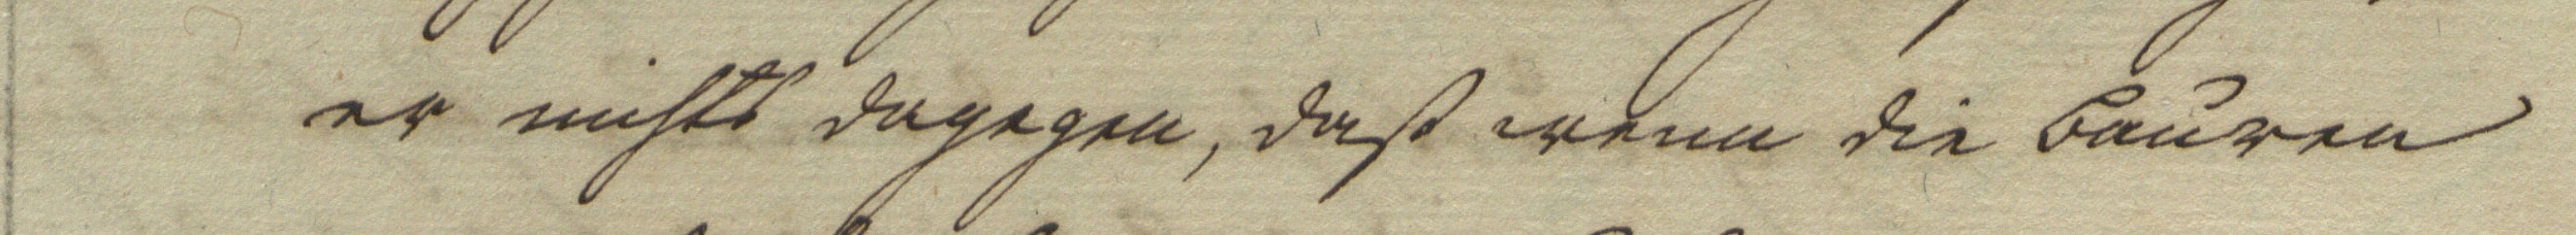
er nichts dagegen, daß wenn die Bauren
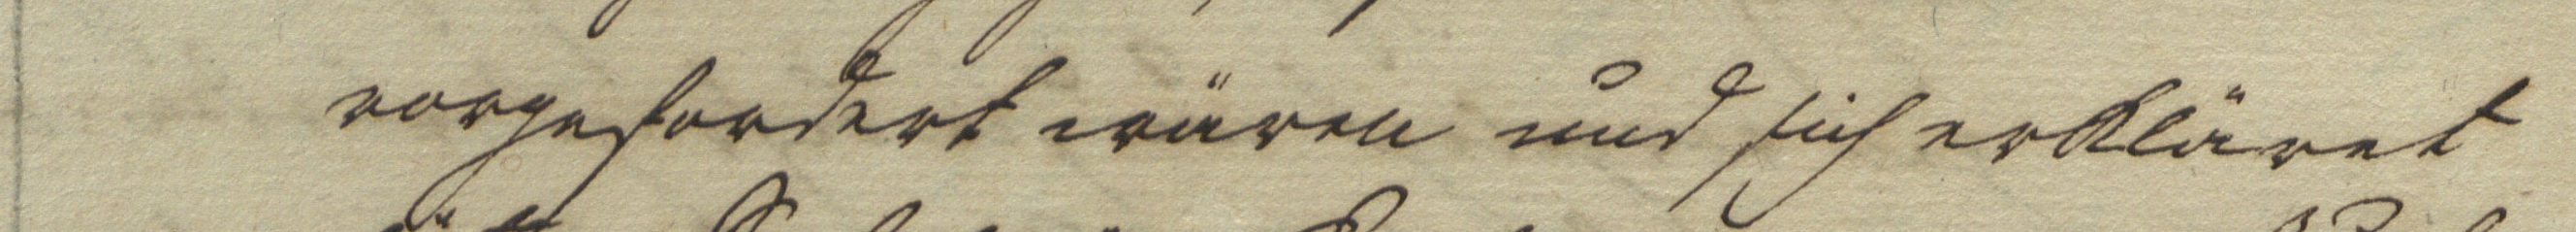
vorgefordert wären und sich erkläret
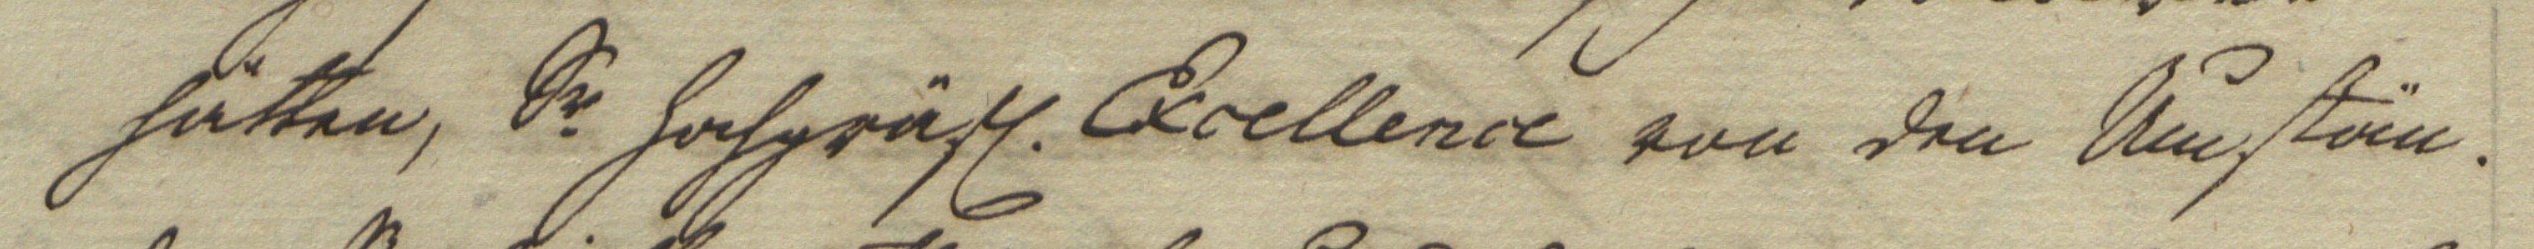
hätten, Sr. hochgräfl. Excellence von den Umstän¬
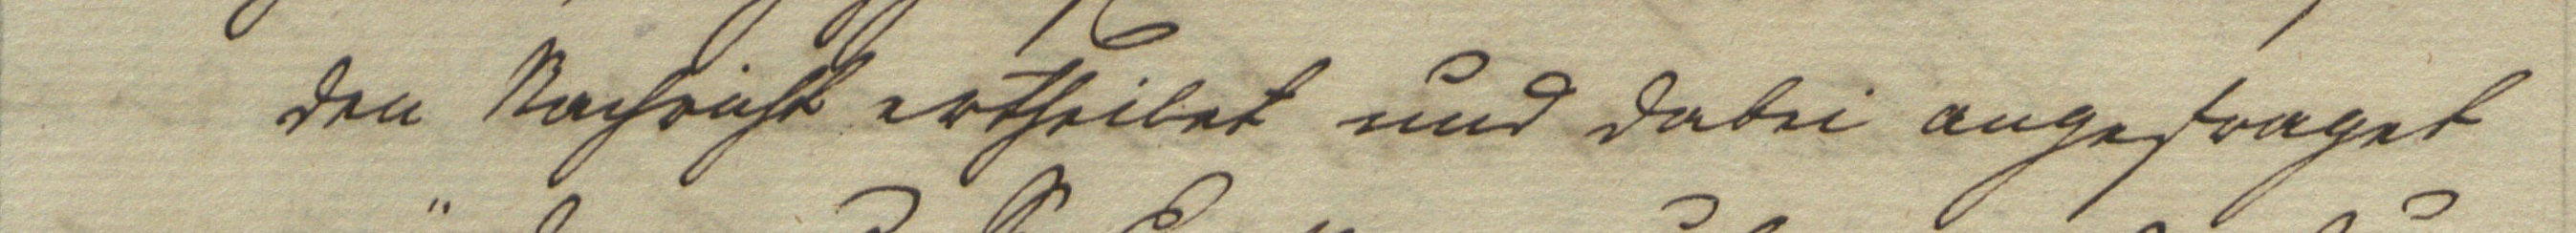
den Nachricht ertheilet und dabei angefraget
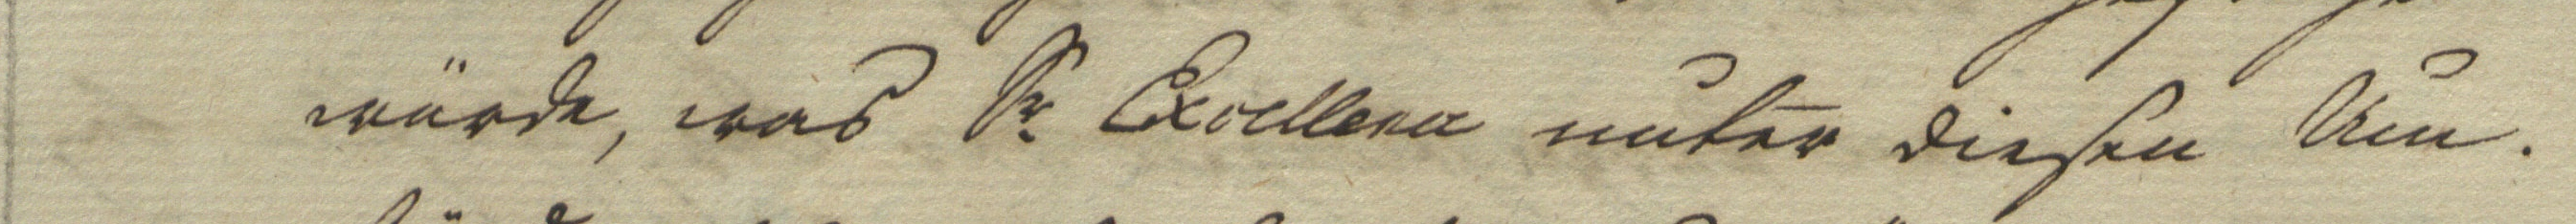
würde, was Sr. Excellence unter diesen Um¬
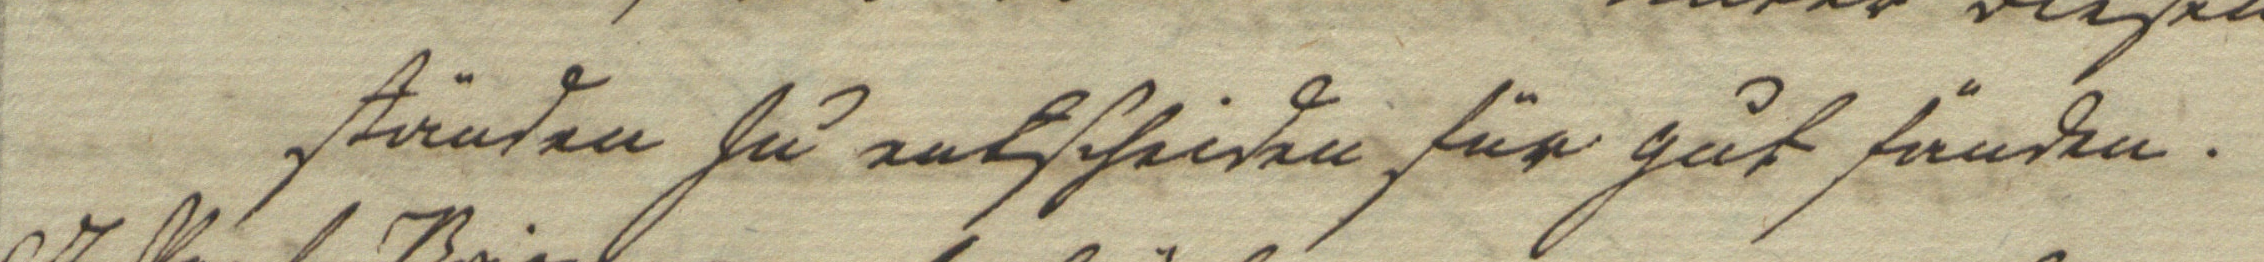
ständen zu entscheiden für gut fänden.
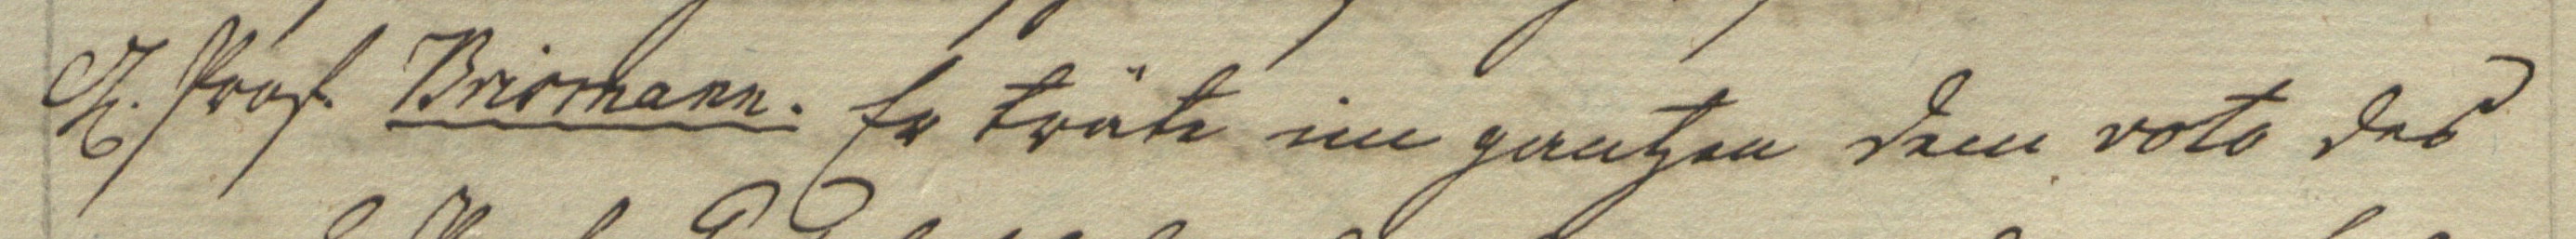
dh. Prof. Brismann. Er träte im ganzten dem voto des
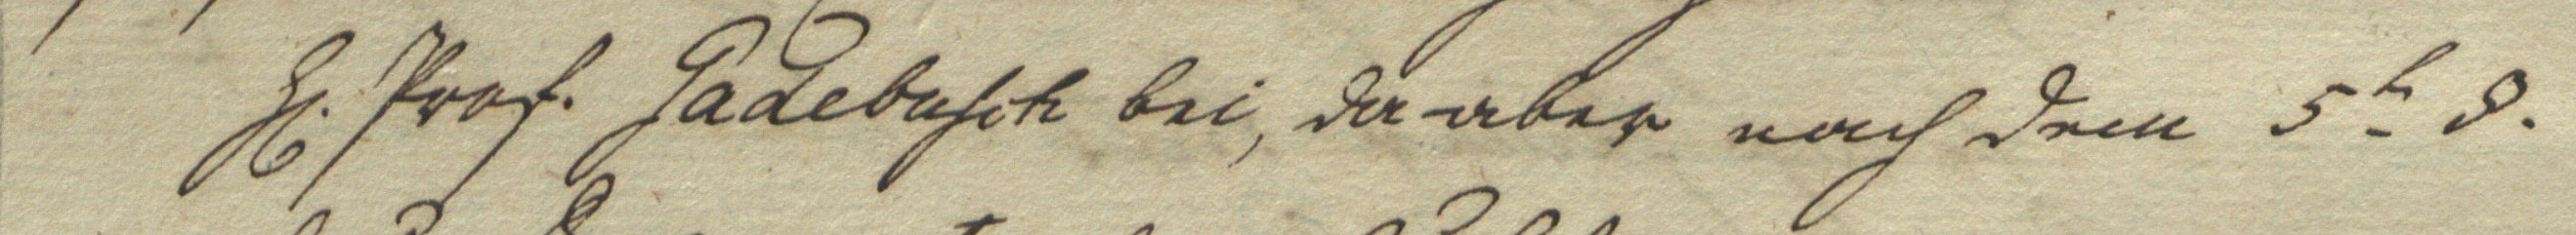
H. Prof. Gadebusch bei, da aber nach dem 5ten §
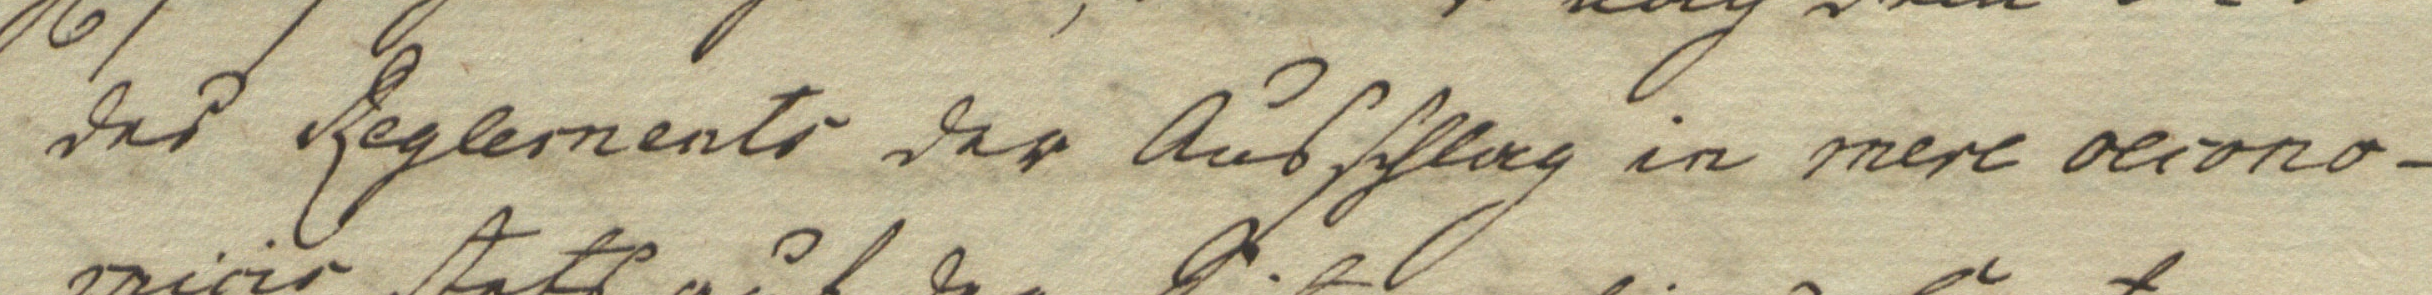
des Reglements der Ausschlag in mere oecono¬
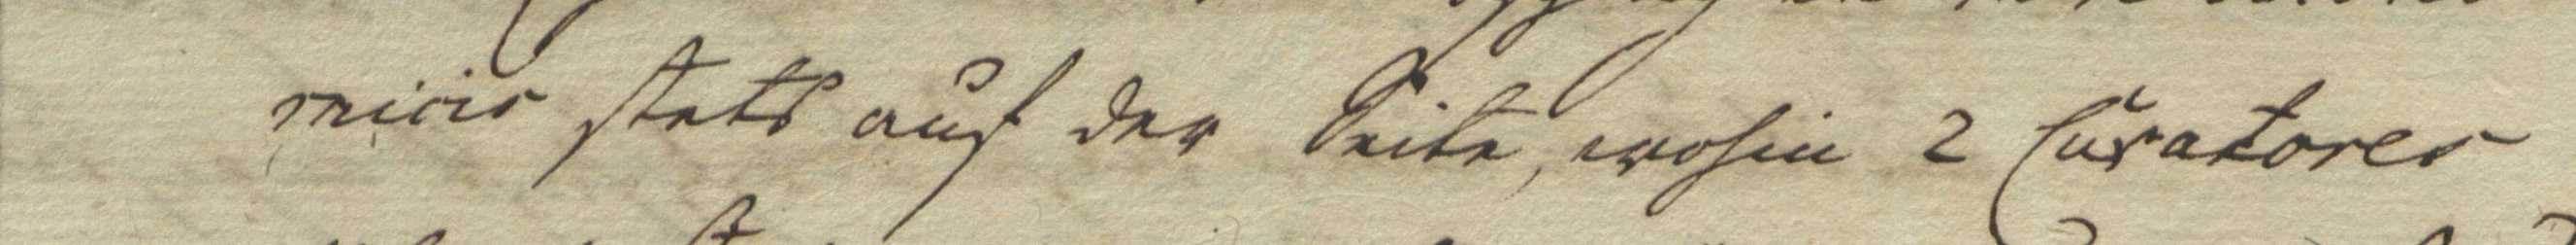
micis stets auf der Seite, wohin 2 Curatores
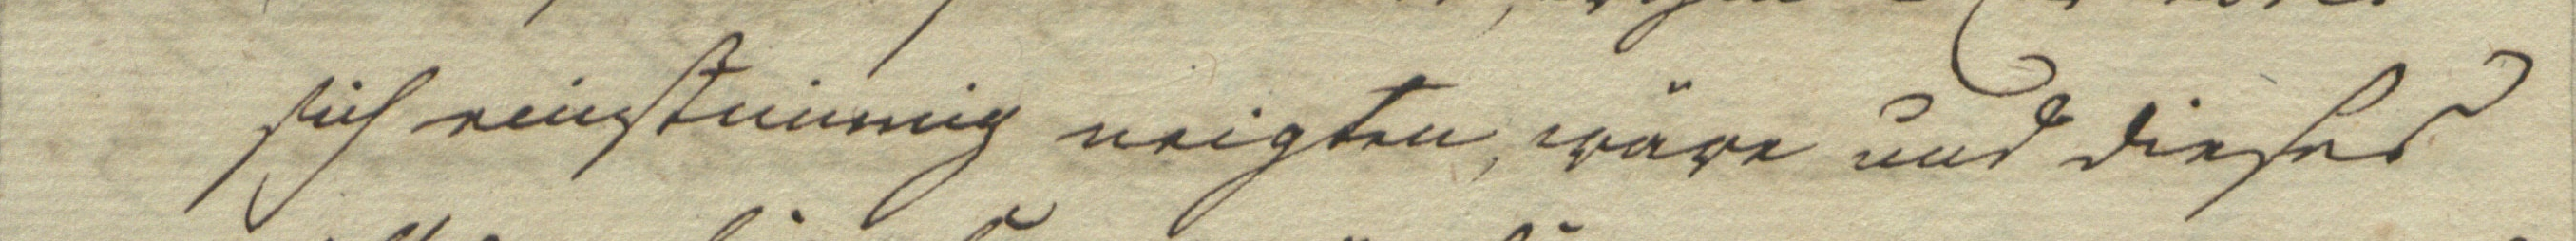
sich einstimmig neigten, wäre und dieses
